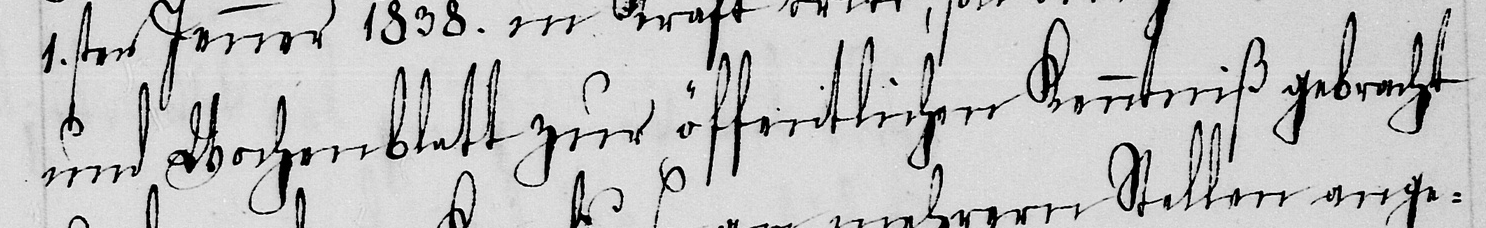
und Wochenblatt zur öffentlichen Kenntniß gebracht
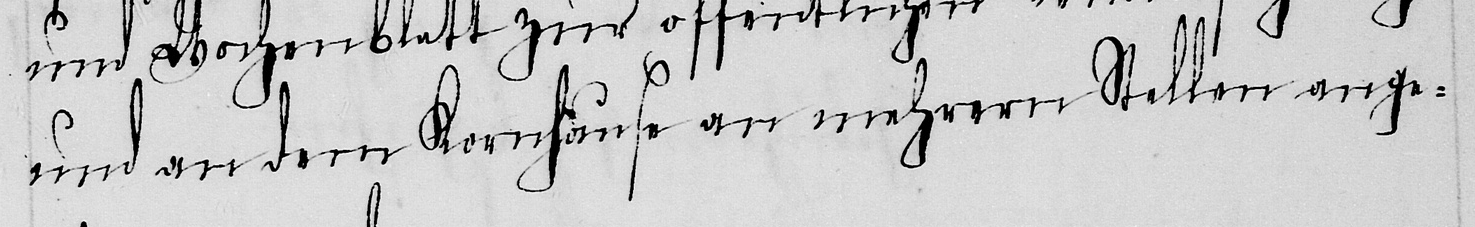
und an dem Kornhause an mehrern Stellen ange¬
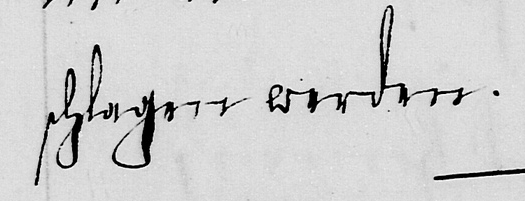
schlagen werden.
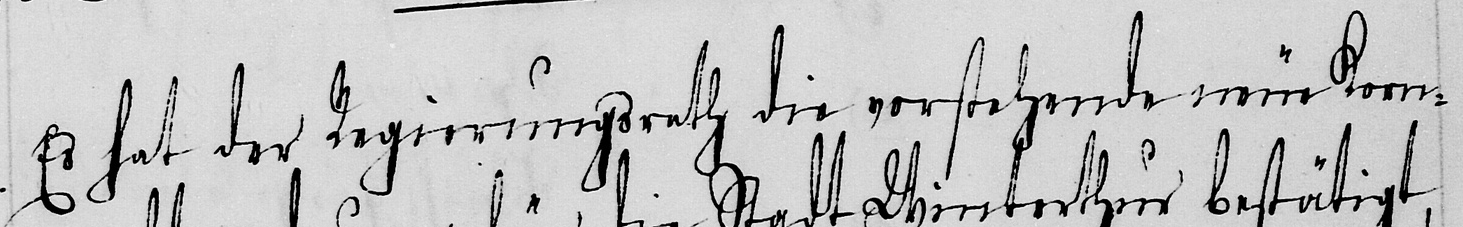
Es hat der Regierungsrath die vorstehende neue Korn¬
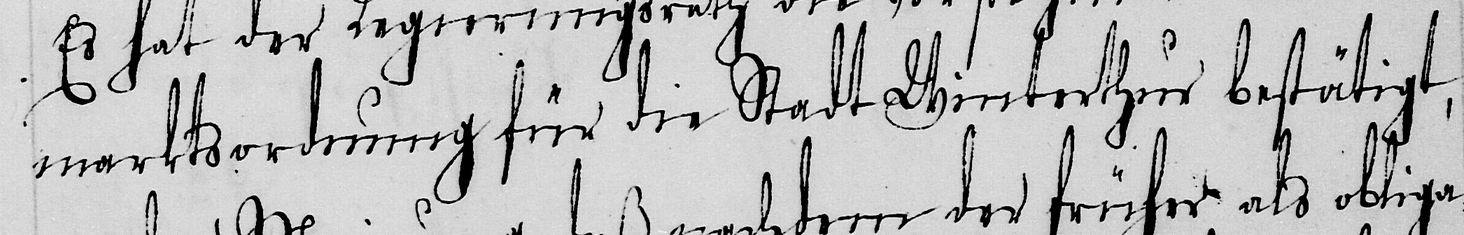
marktsordnung für die Stadt Winterthur bestätigt,
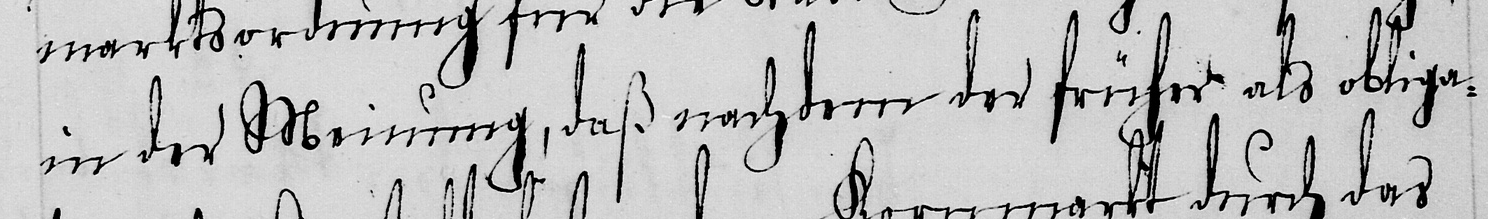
in der Meinung, daß nachdem der früher als obliga¬
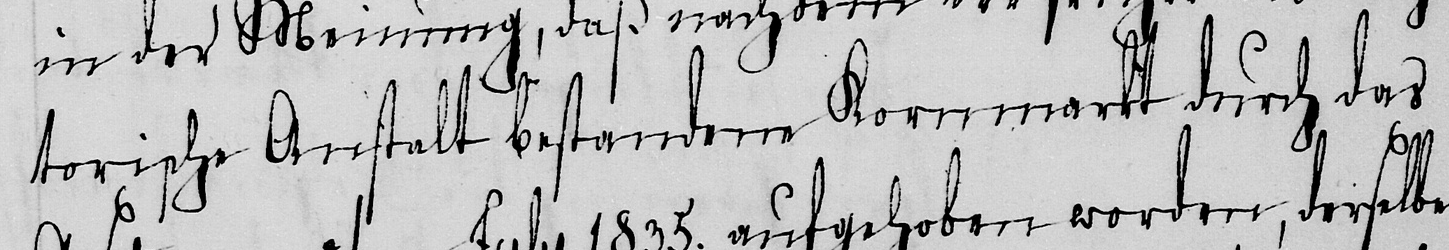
torische Anstalt bestandene Kornmarkt durch das
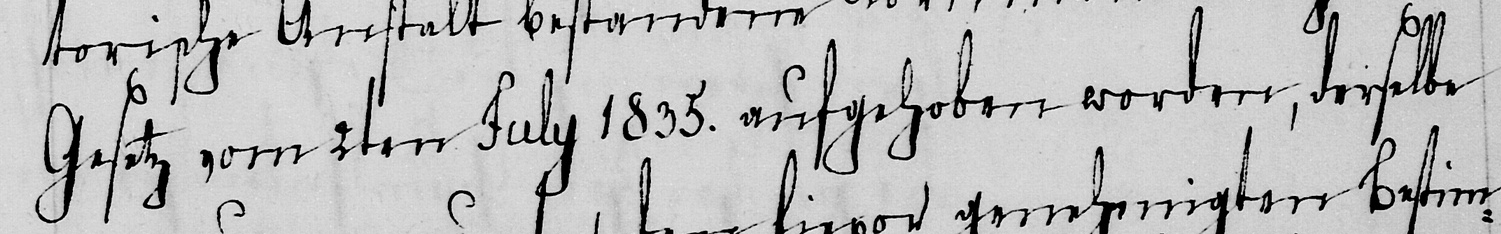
Gesetz vom 2ten July 1835. aufgehoben worden, derselbe
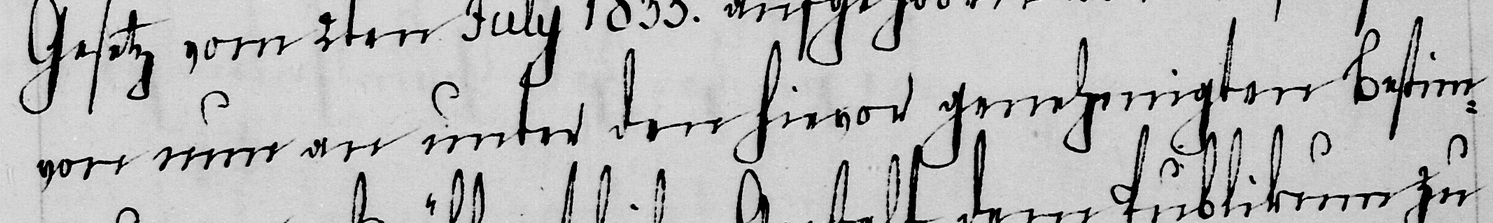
von nun an unter den hievor genehmigten Bestim¬
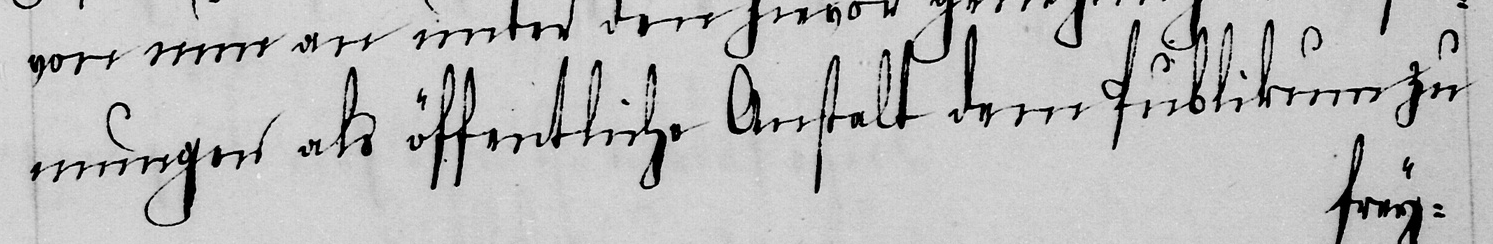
mungen als öffentliche Anstalt dem Publikum zu
